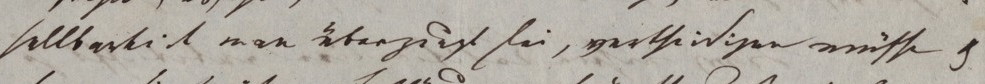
haltbarkeit man überzeugt sei, vertheidigen müsse &
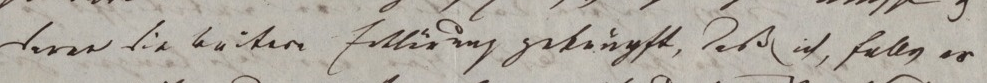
daran die weitere Erklärung geknüpft, daß ich, falls es
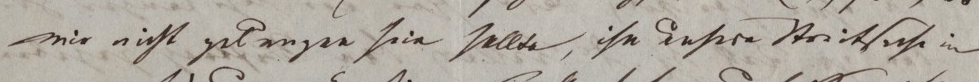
mir nicht gelungen sein sollte, ihn unsere Streitsache in
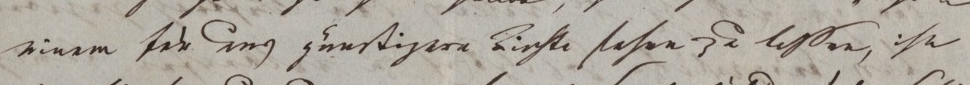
einem für uns güngstigern Lichte sehen zu lassen, ihn
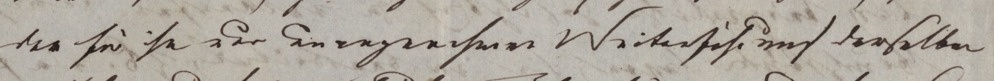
der für ihn nur unangenehmen Weiterführung derselben
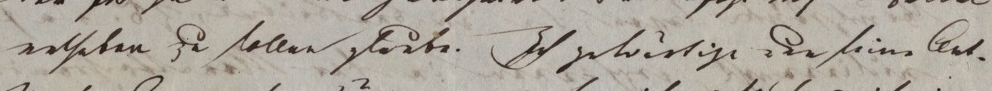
entheben zu sollen glaube. Ich gewärtige nun seine Ant-
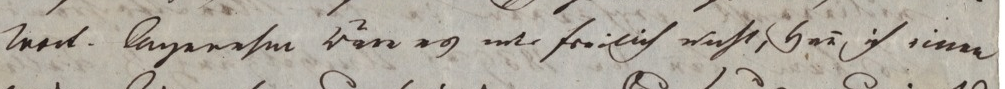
wort. Angenehm wäre es mir freilich nicht, wenn ich einen
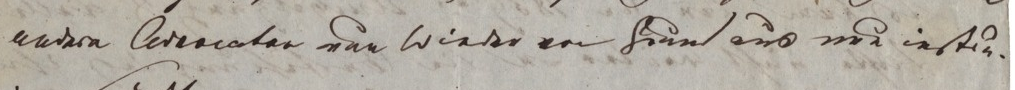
andern Advocaten nun wieder von Grund aus neu instru-
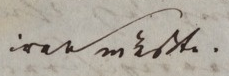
iren müßte.
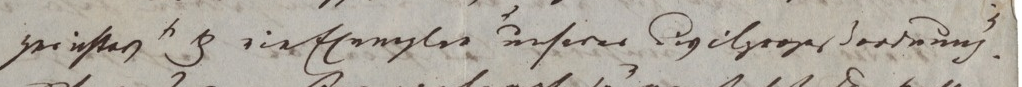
gerichtes «& ein Exemplar unserer Civilprozeßordnung».
